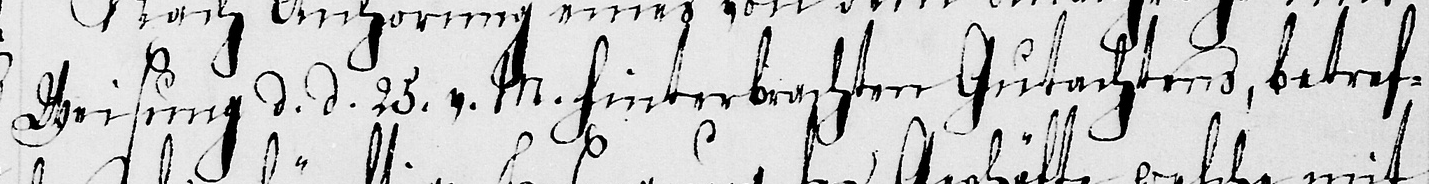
Weisung d. d. 25. v. M. hinterbrachten Gutachtens, betref¬
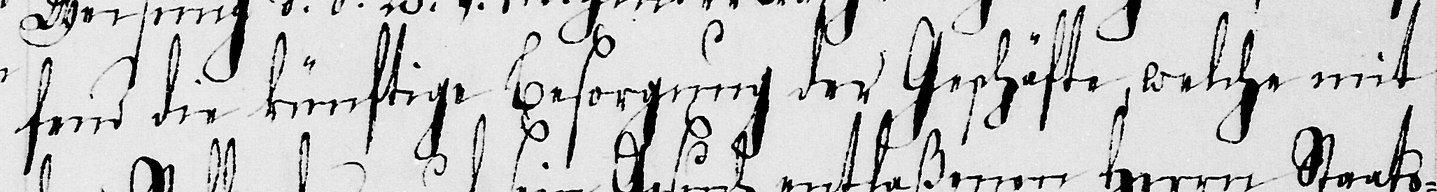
fend die künftige Besorgung der Geschäfte, welche mit
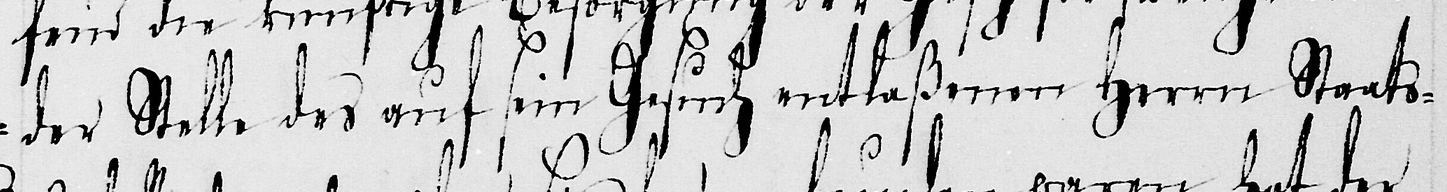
der Stelle des auf sein Gesuch entlaßenen Herrn Staats-
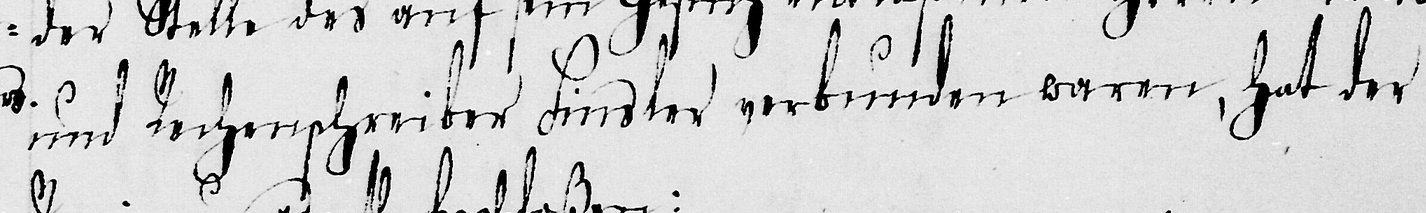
und Rechenschreiber Finsler verbunden waren, hat der
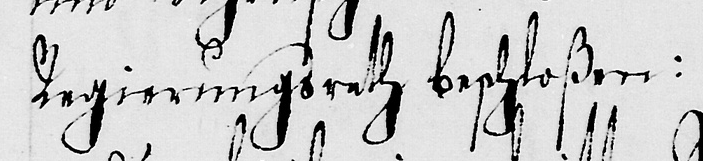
Regierungsrath beschloßen:
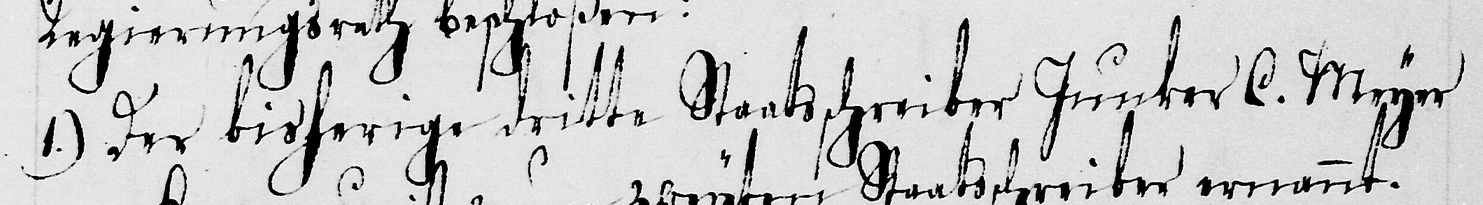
1.) Der bisherige dritte Staatsschreiber Junker C. Meyer
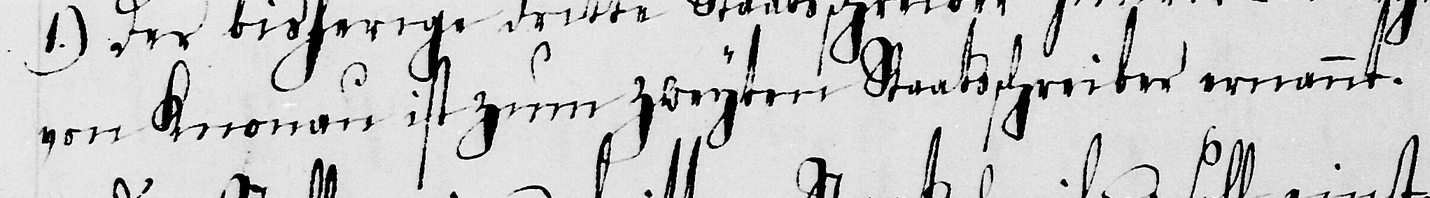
von Knonau ist zum zweyten Staatsschreiber ernannt.
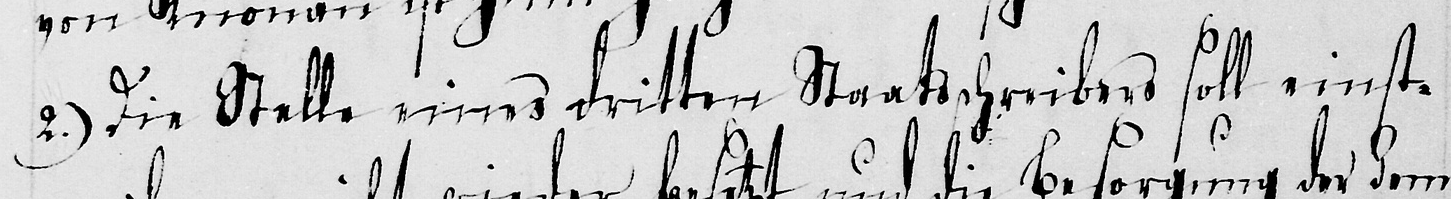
2.) Die Stelle eines dritten Staatsschreibers soll einst¬
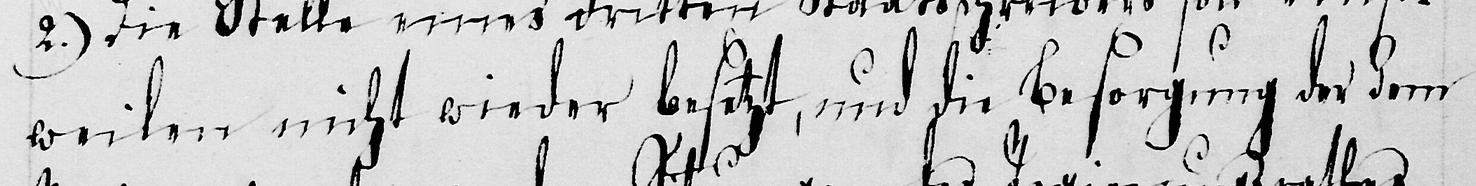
weilen nicht wieder besetzt, und die Besorgung der dem
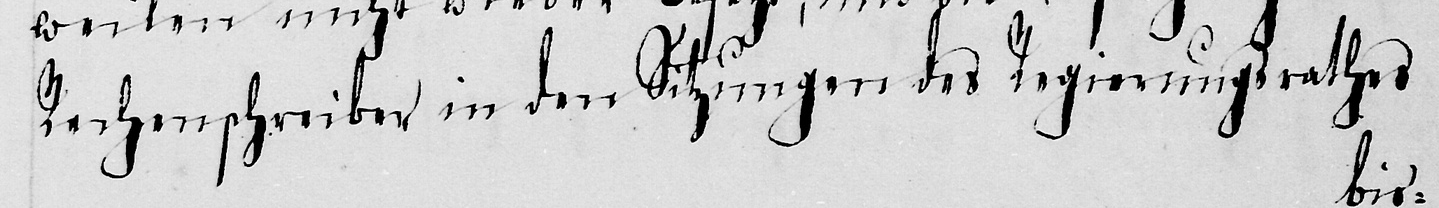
Rechenschreiber in den Sitzungen des Regierungsrathes
